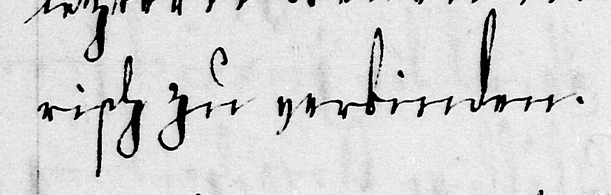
orisch zu verbinden.
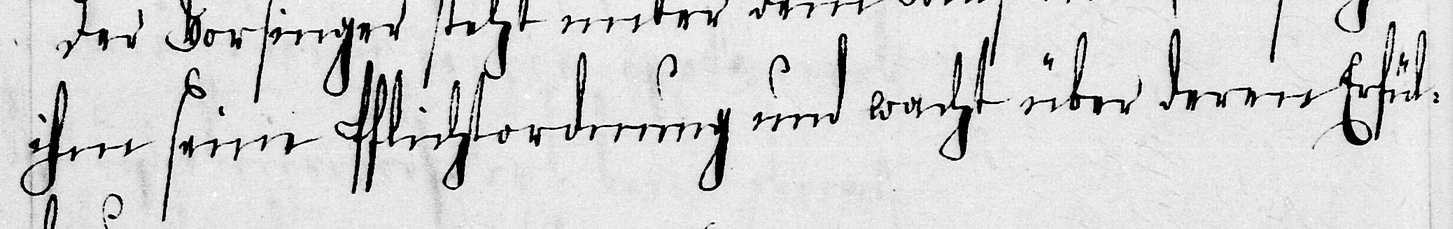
ihm seine Pflichtordnung und wacht über deren Erfü¬
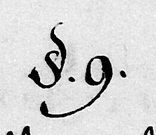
§. 9.
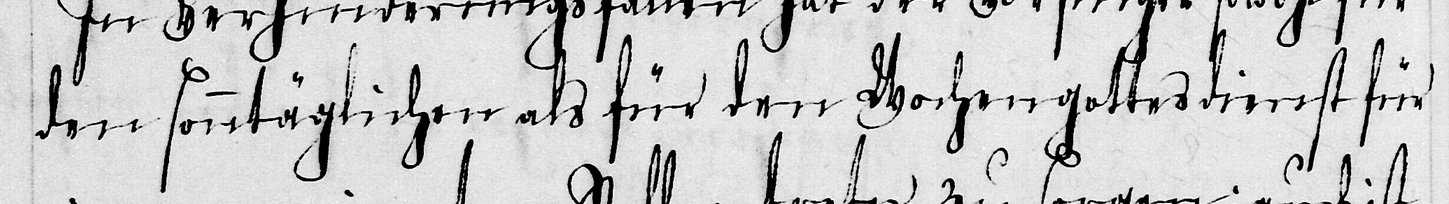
den sonntäglichen als für den Wochengottesdienst für
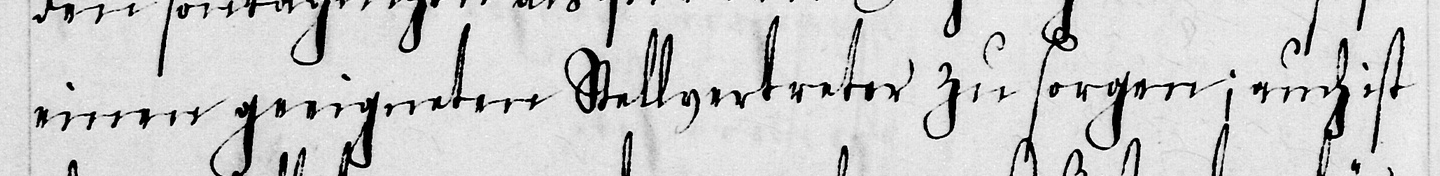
einen geeigneten Stellvertreter zu sorgen; auch ist
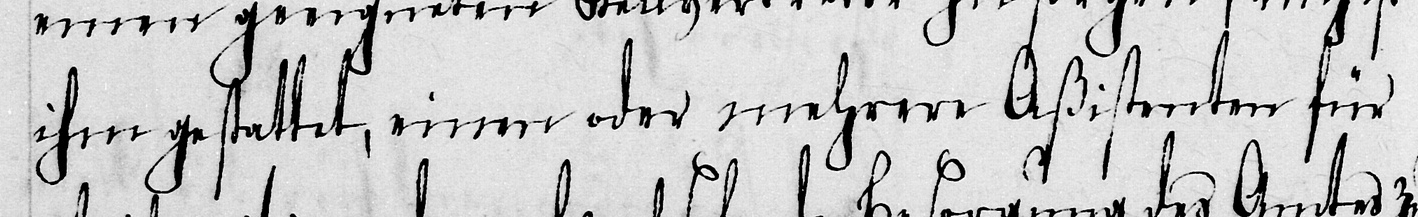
ihm gestattet, einen oder mehrere Aßistenten für
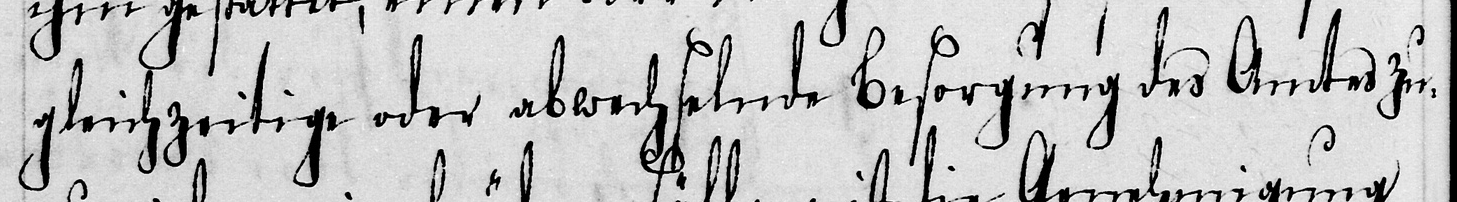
gleichzeitige oder abwechselnde Besorgung des Amtes zu¬
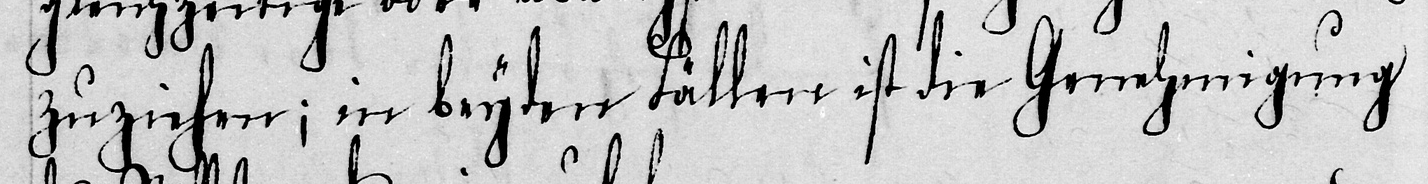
zuziehen; in beyden Fällen ist die Genehmigung
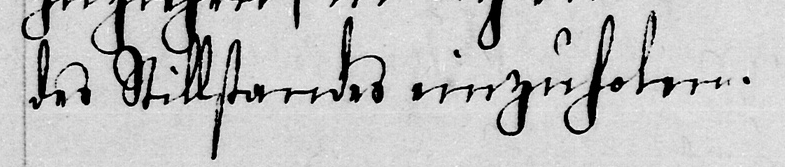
des Stillstandes einzuholen.
